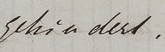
gehindert.
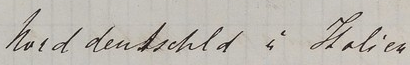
Norddeutschld u Italien
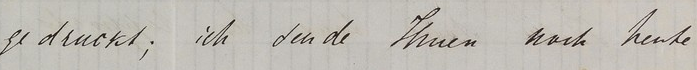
gedruckt; ich sende Ihnen noch heute
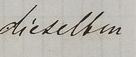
dieselben ein.
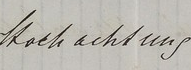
Hochachtung
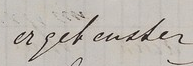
ganz ergebenster
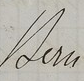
Bern
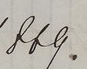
1869.
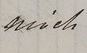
freundlichst
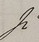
der
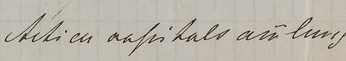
Actiencapitalsammlung
